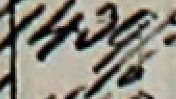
1439/
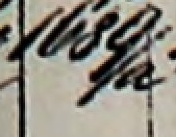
1689/a
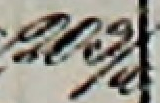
203/a
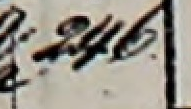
246
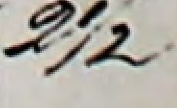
2 1/2
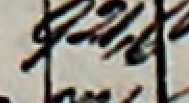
921,6
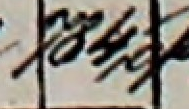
784,0
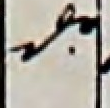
Do
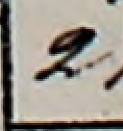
2
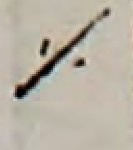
./.
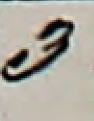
3
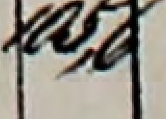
105,6
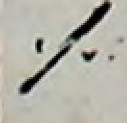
./.
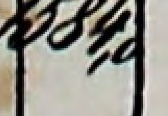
1584,0
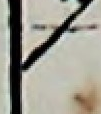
7
